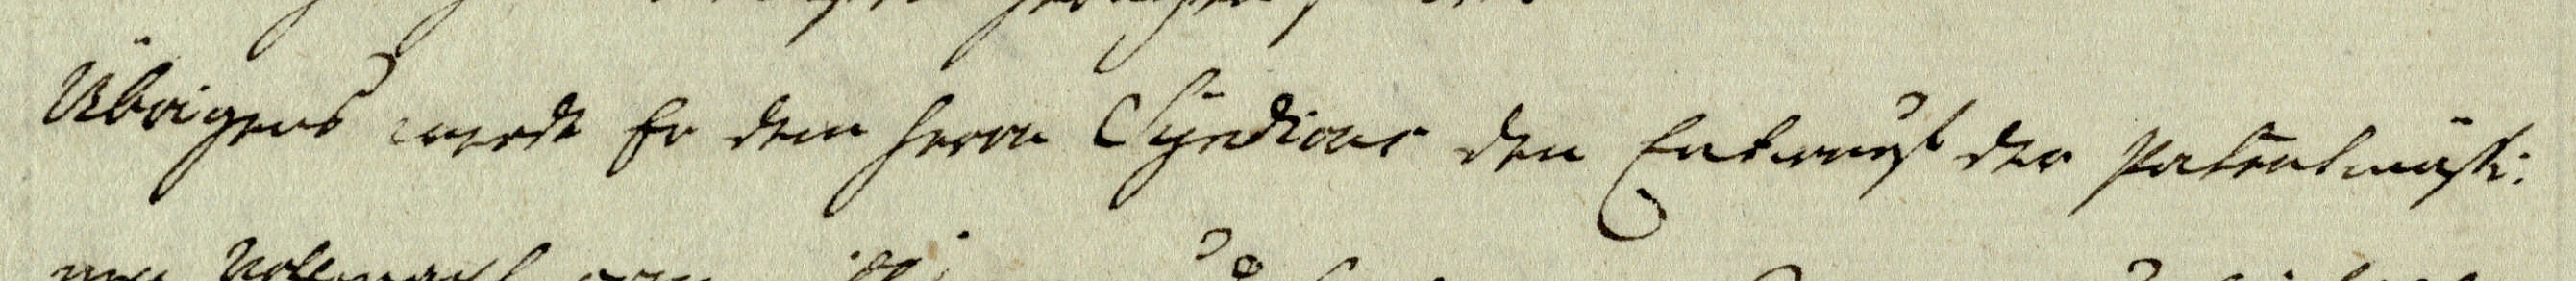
Übrigens werde Er dem Herrn Sÿndicus den Entwurf der patentmässi¬
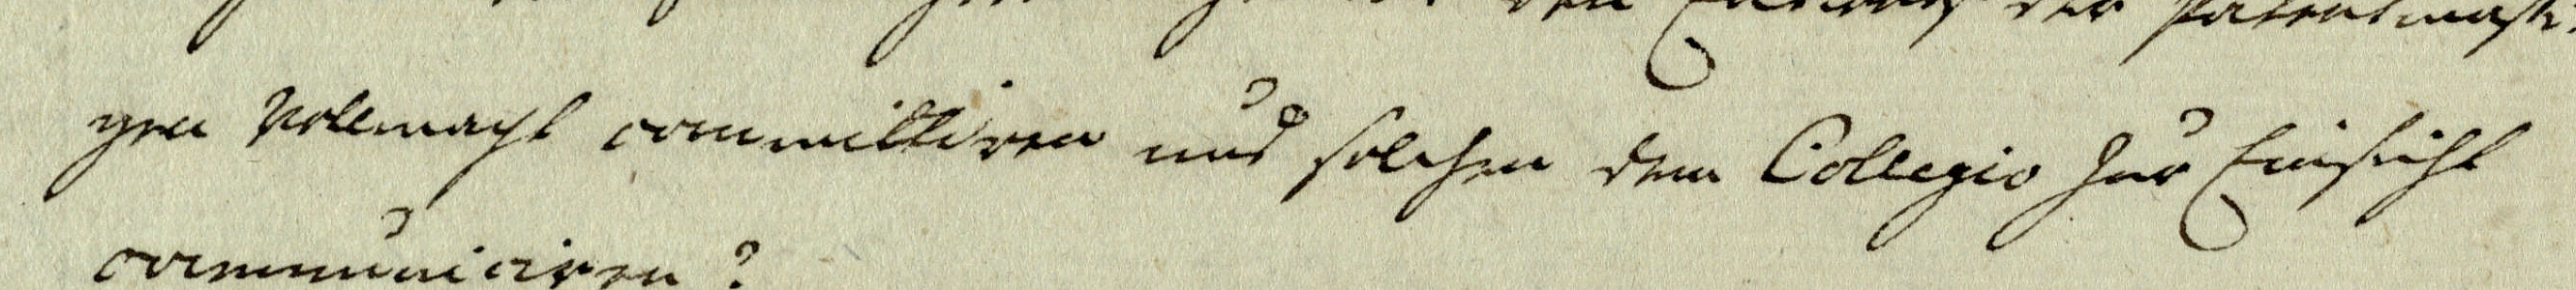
gen Vollmacht committiren und solchen dem Collegio zur Einsicht
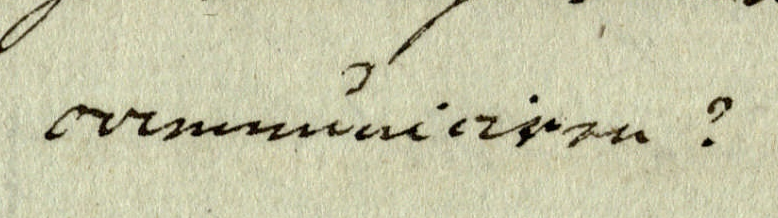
communiciren ?
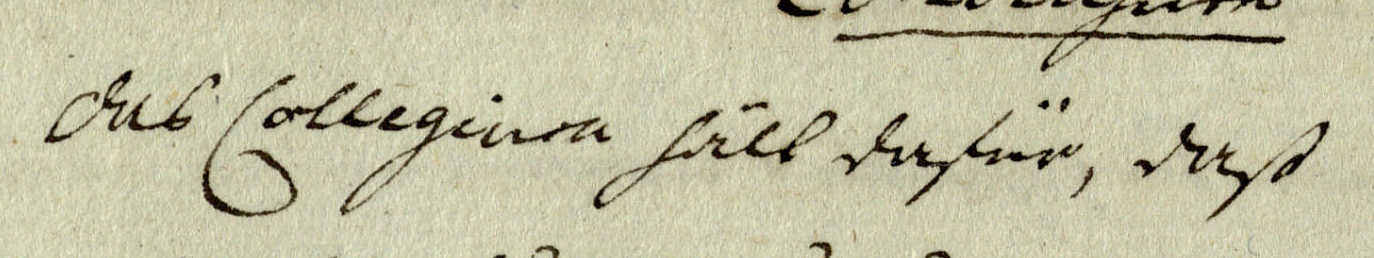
Das Collegium hält dafür, daß
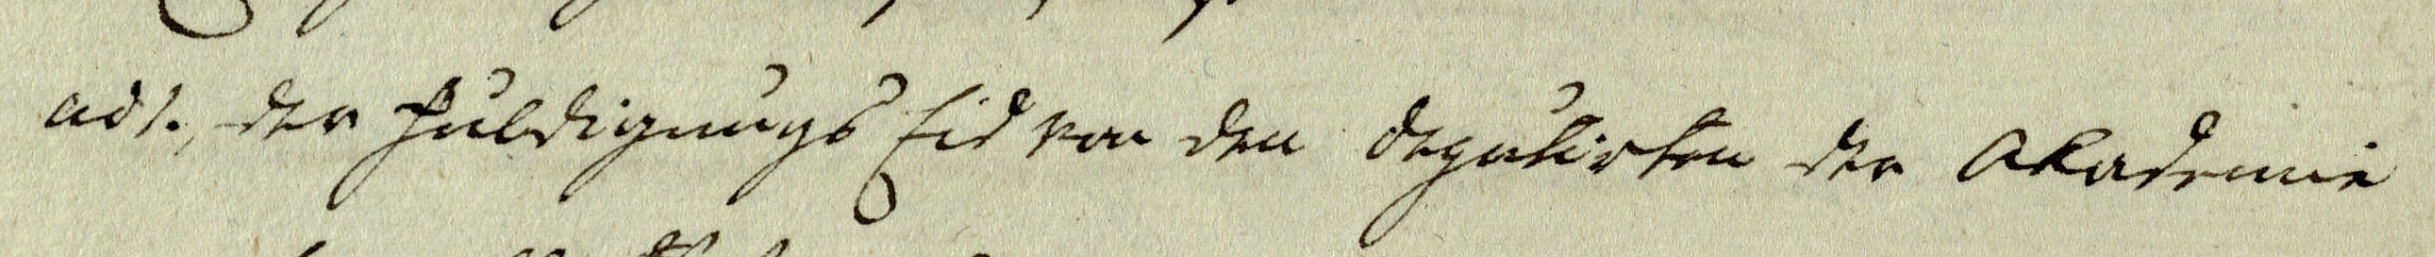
ad 1., der Huldigungs Eid von den Deputirten der Akademie
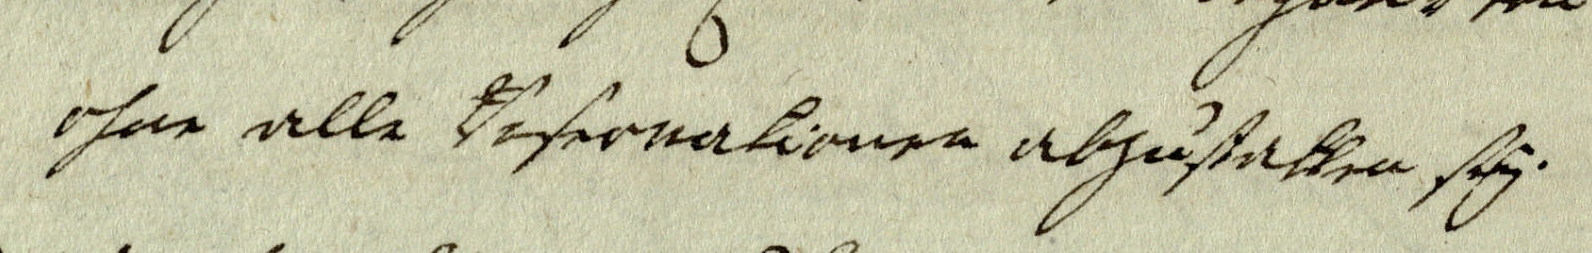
ohne alle Reservationen abzustatten seÿ.
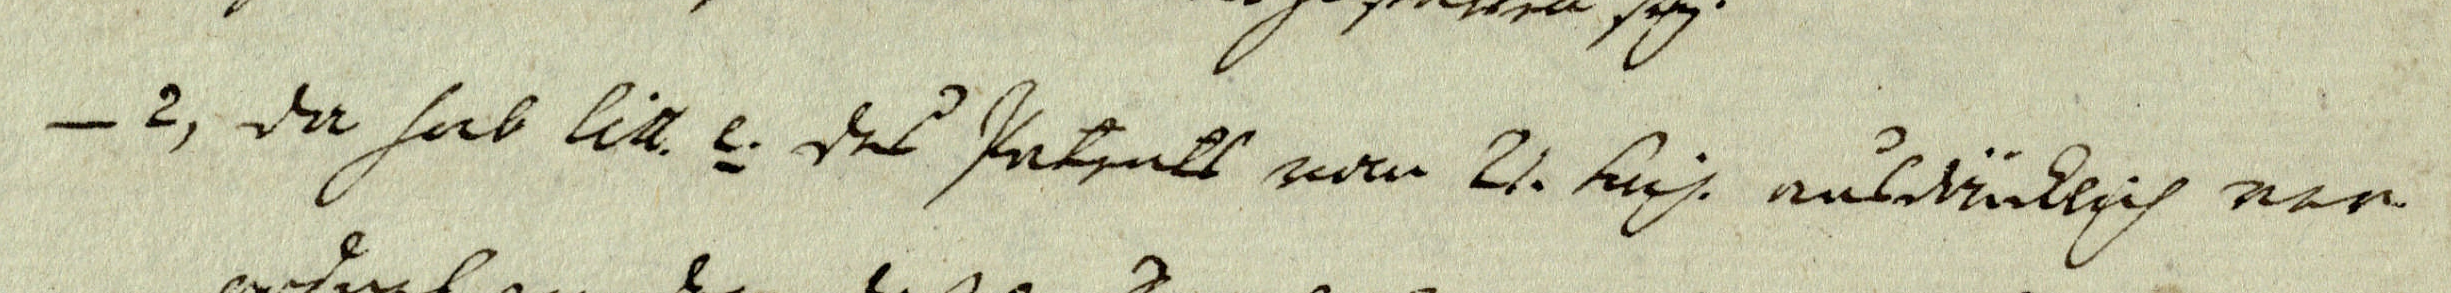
2, da sub litt. a. des Patents vom 21. huj. ausdrücklich ver¬
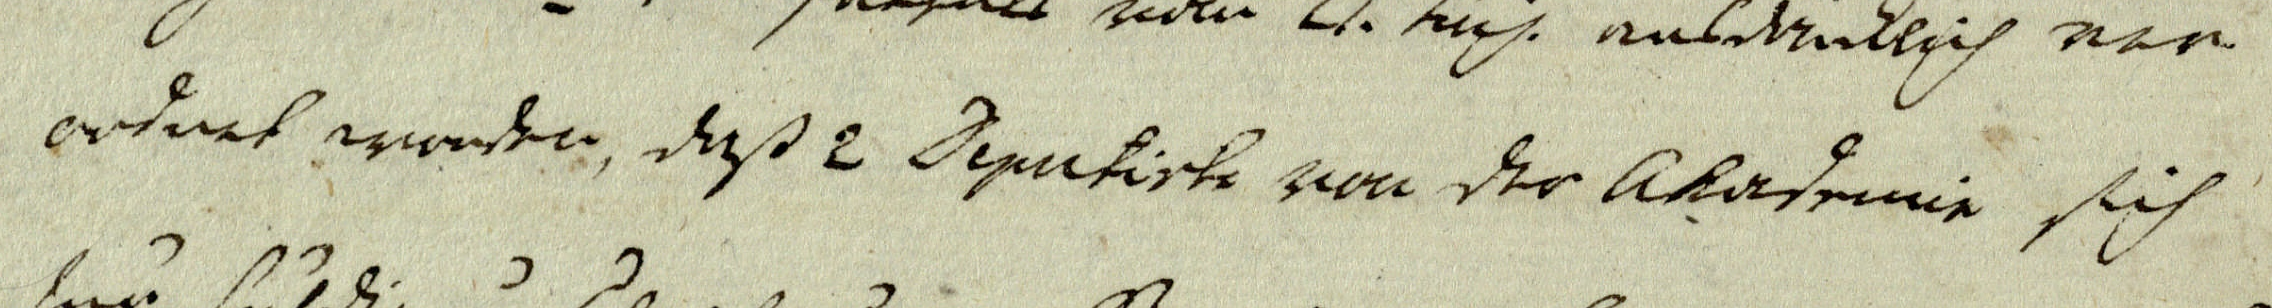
ordnet worden, daß 2 Deputirte von der Akademie sich
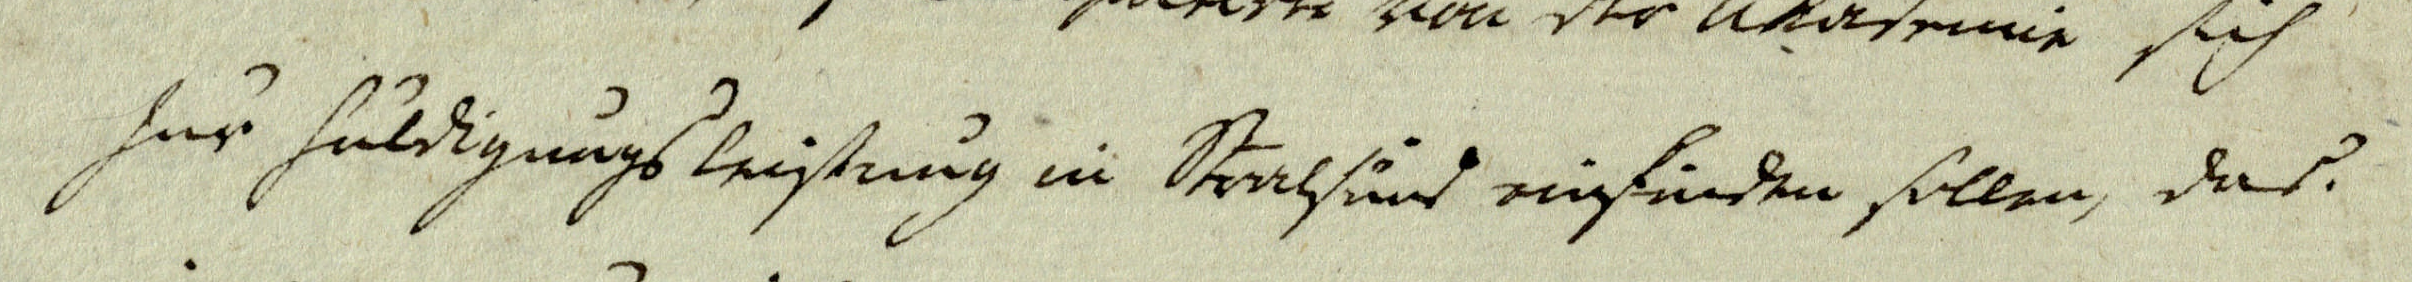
zur Huldigungsleistung in Stralsund einfinden sollen, das¬
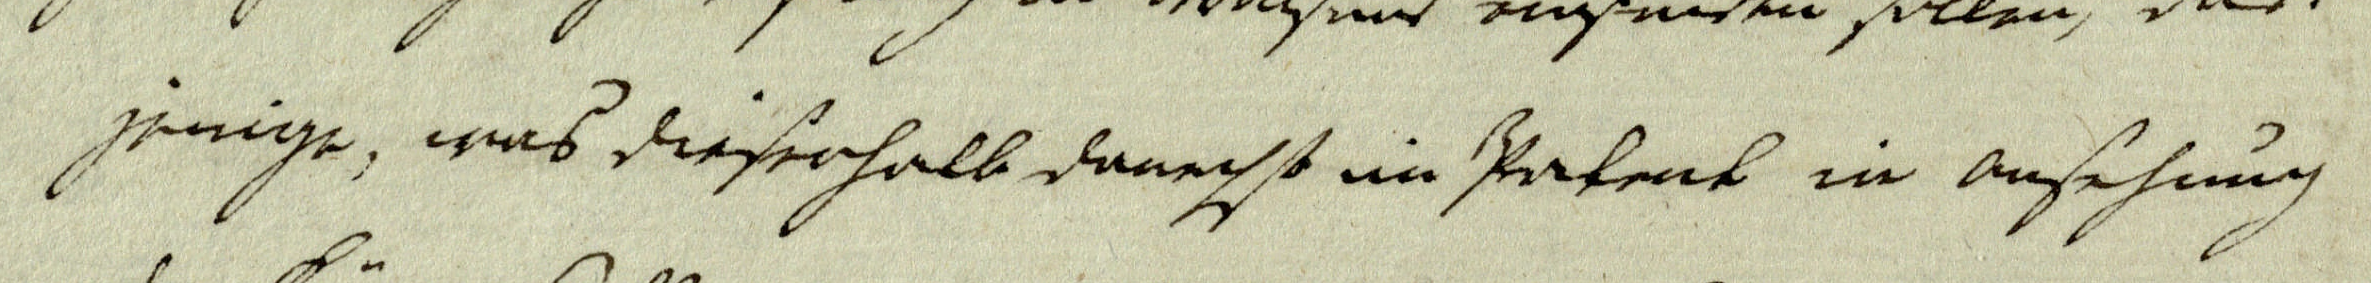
jenige, was dieserhalb danechst im Patent in Ansehung
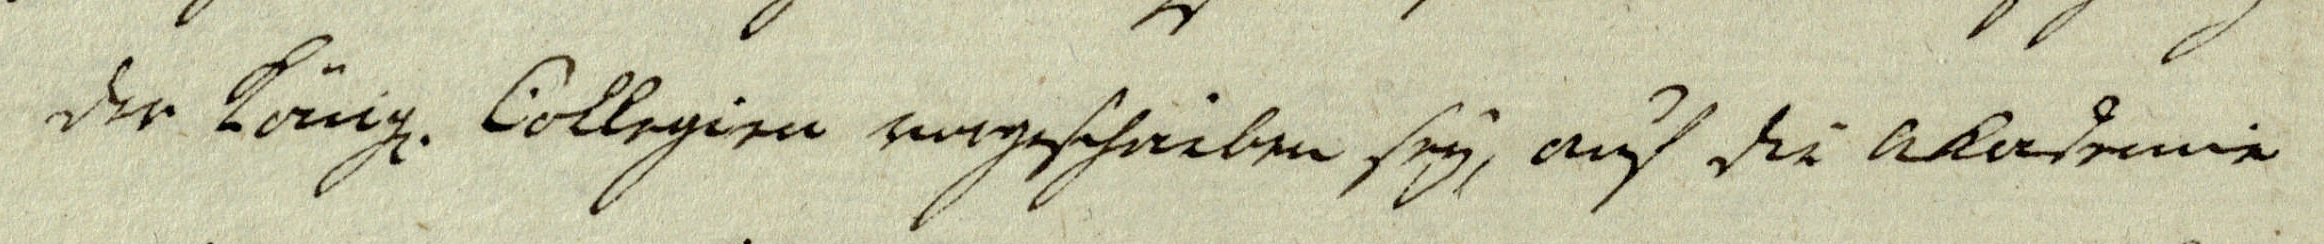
der Königl. Collegien vorgeschrieben seÿ, auf die Akademie
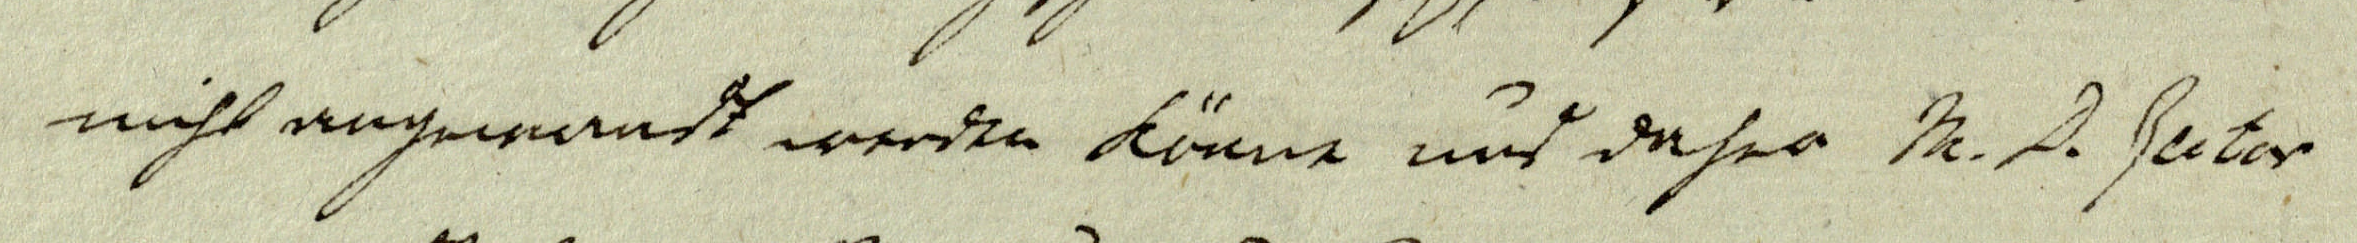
nicht angewandt werden könne und daher M. D. Rector
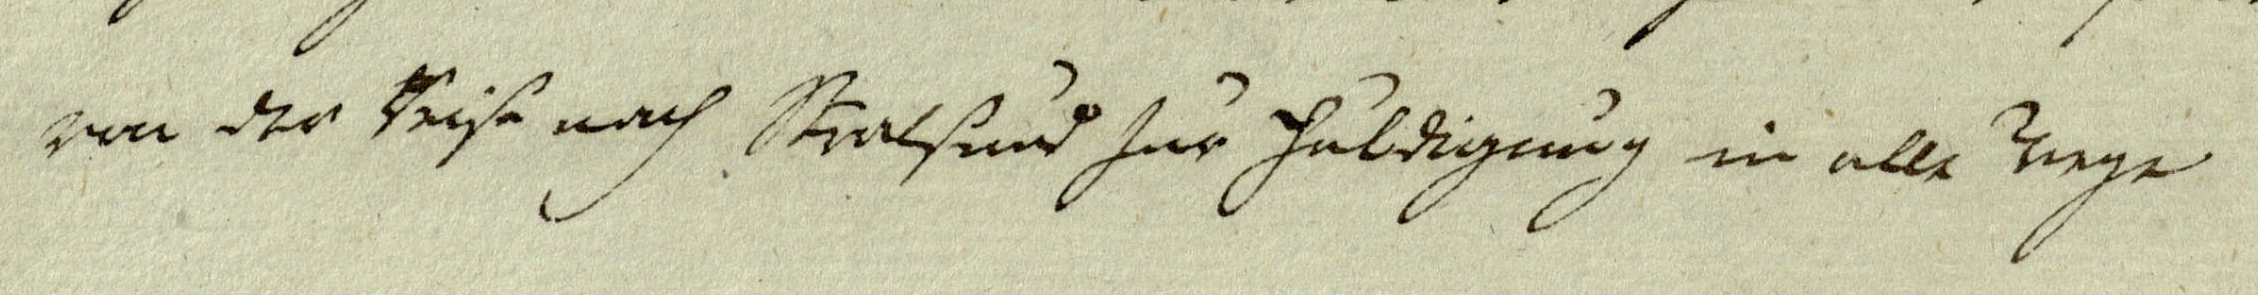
von der Reise nach Stralsund zur Huldigung in alle Wege
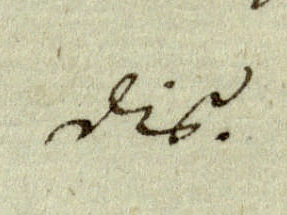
dis¬
